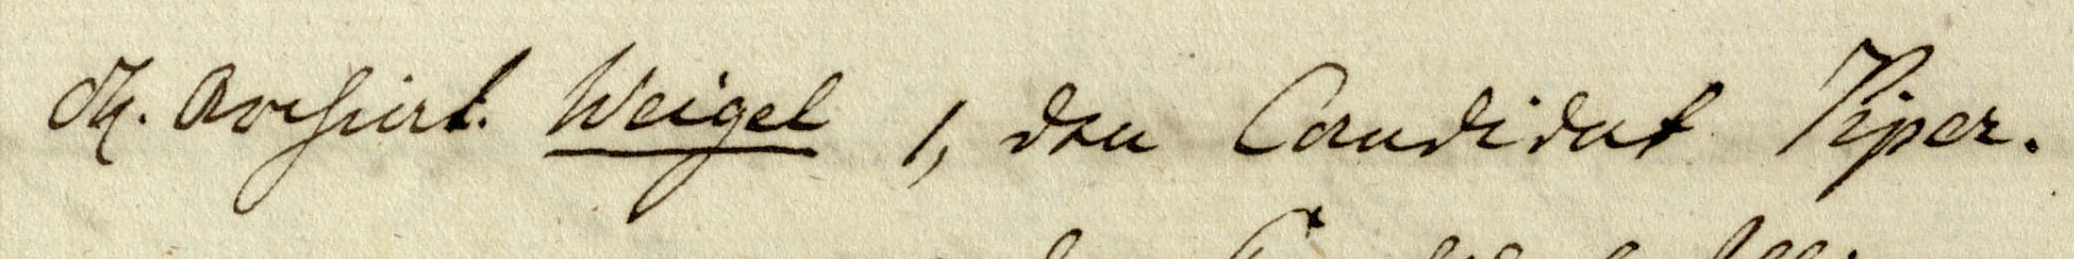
dh. Archiat. Weigel 1, den Candidat Piper.
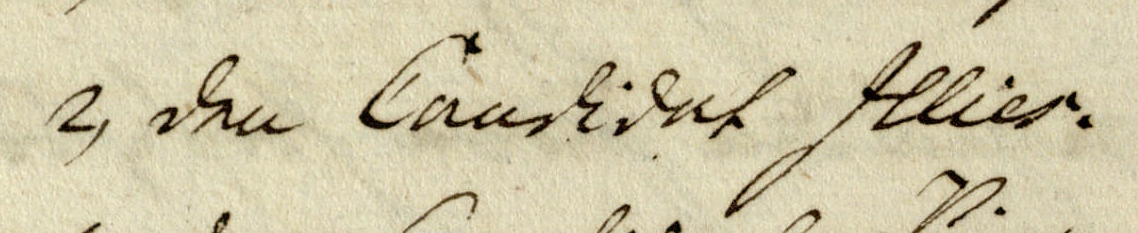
2, den Candidat Illies.
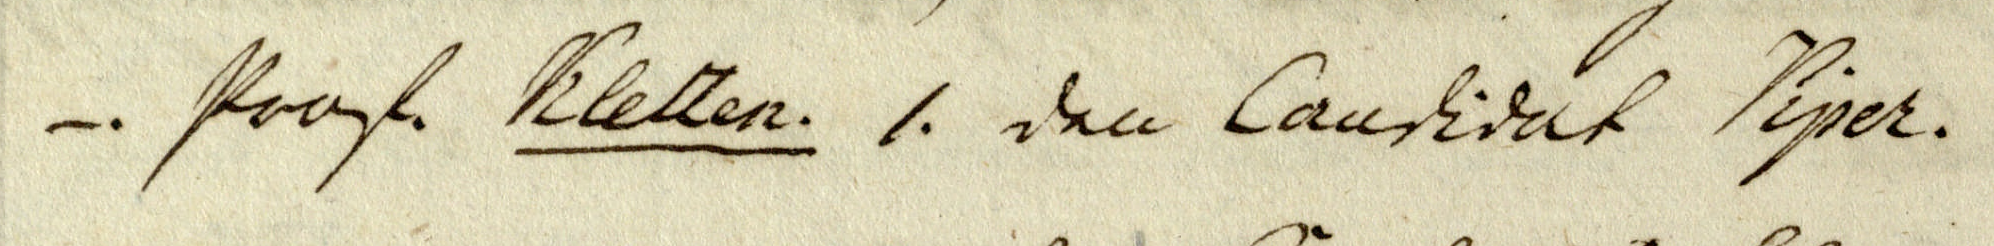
Prof. Kletten. 1. den Candidat Piper.
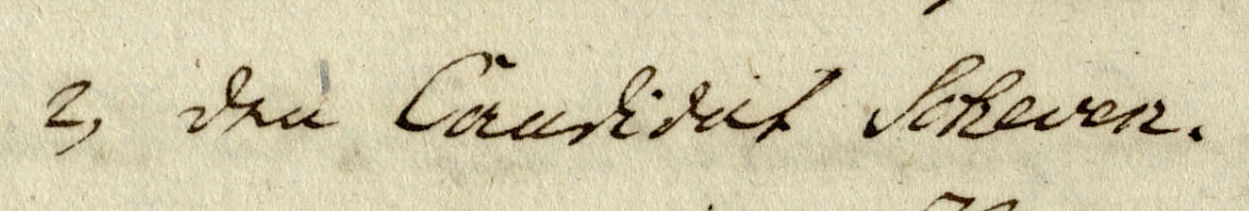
2, den Candidat Scheven.
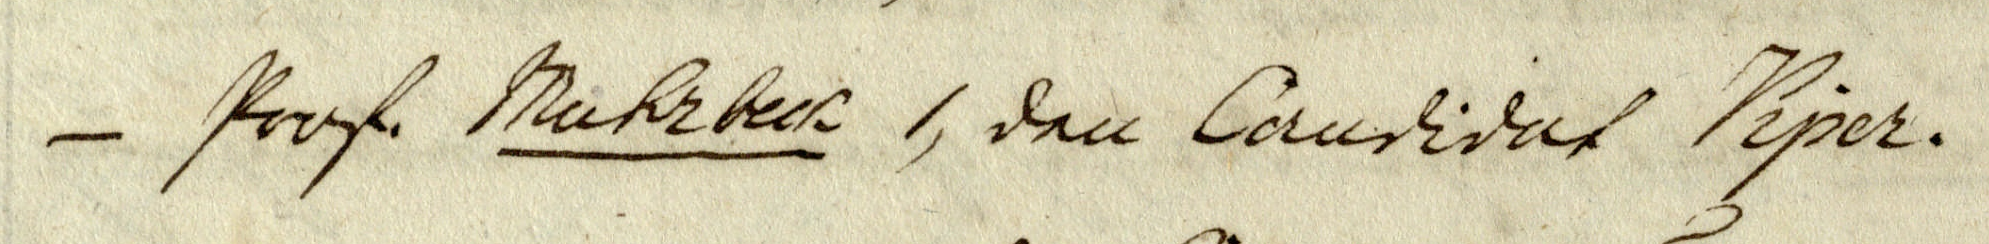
Prof. Muhrbeck 1, den Candidat Piper.
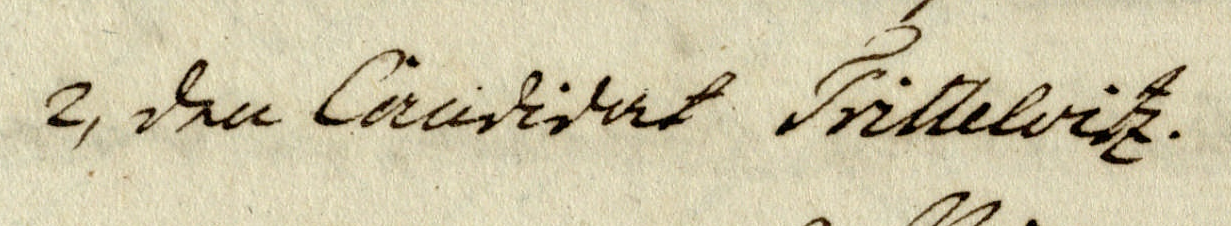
2, den Candidat Trittelvitz.
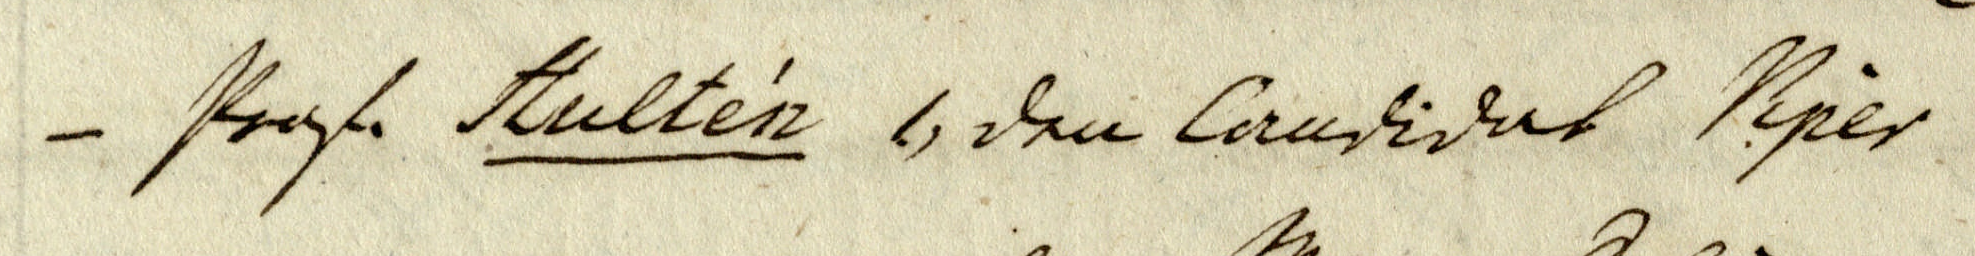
Prof. Hultén 1, den Candidat Piper
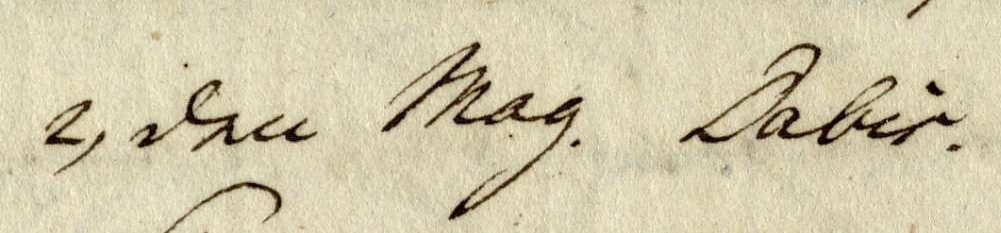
2, den Mag. Dabis.
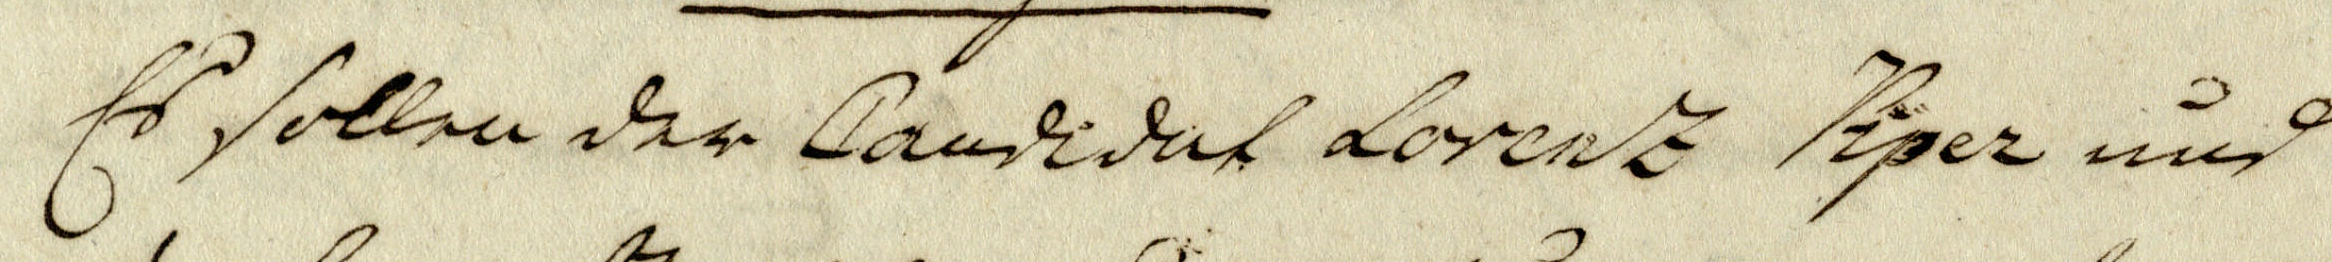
Es sollen der Candidat Lorenz Piper und
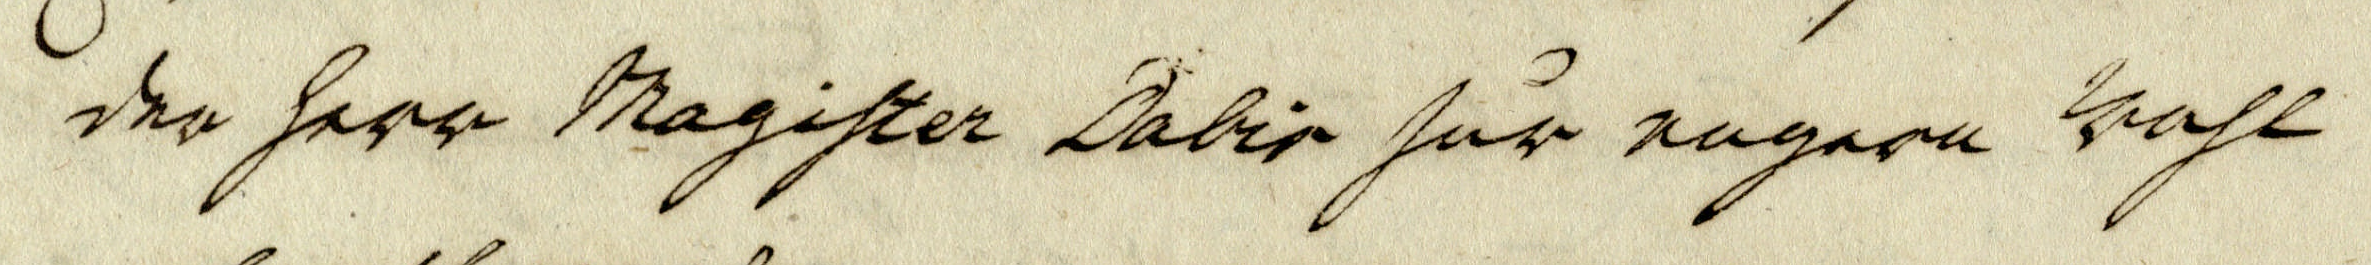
der Herr Magister Dabis zur engern Wahl
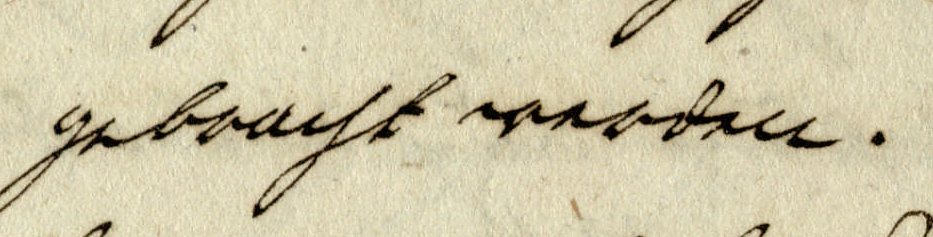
gebracht werden.
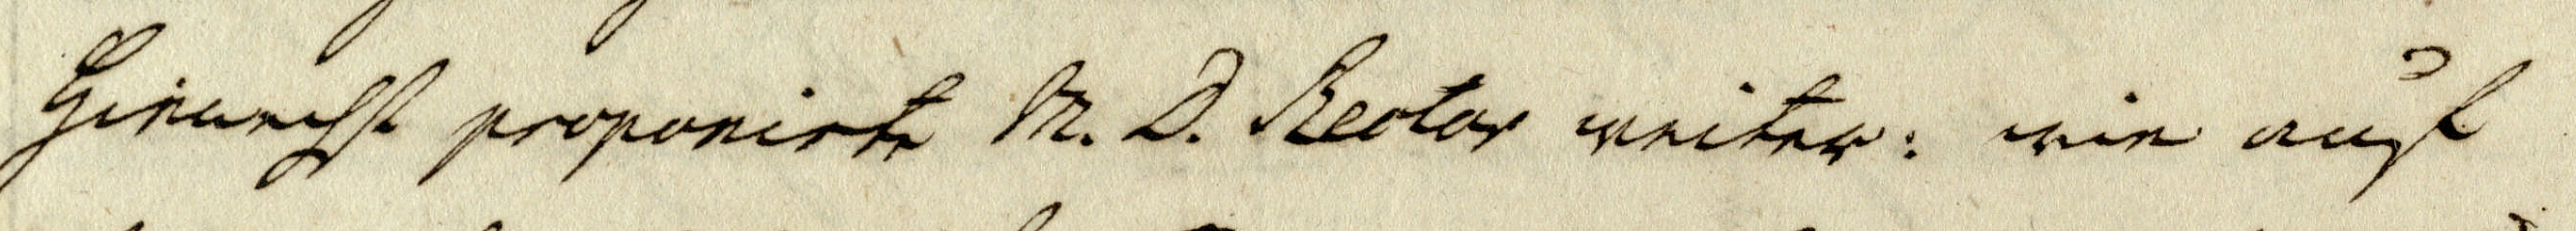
Hienechst proponirte M. D. Rector weiter: wie auf
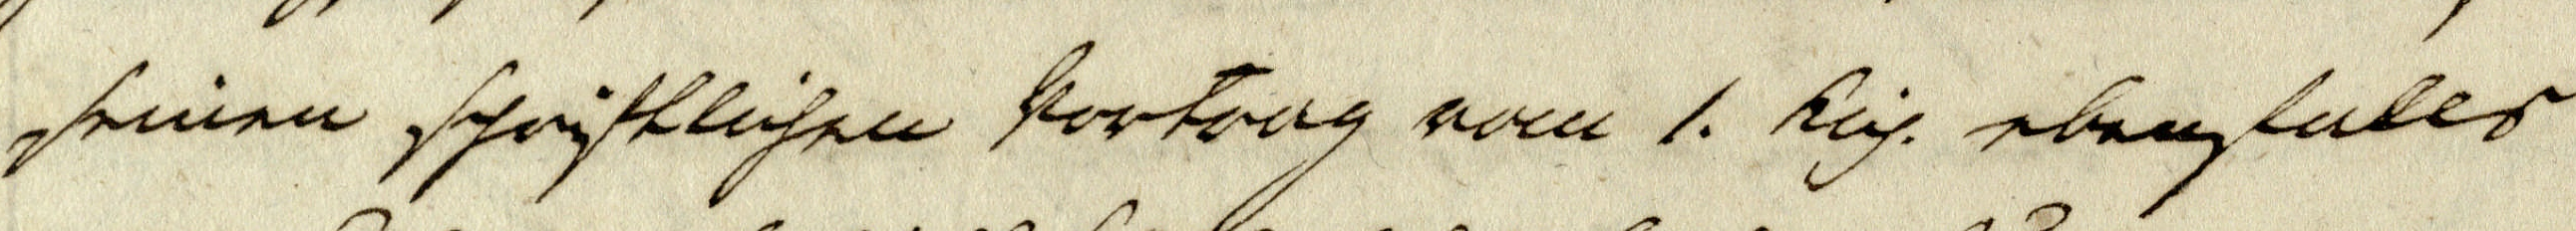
seinen schriftlichen Vortrag vom 1. huj. ebenfalls
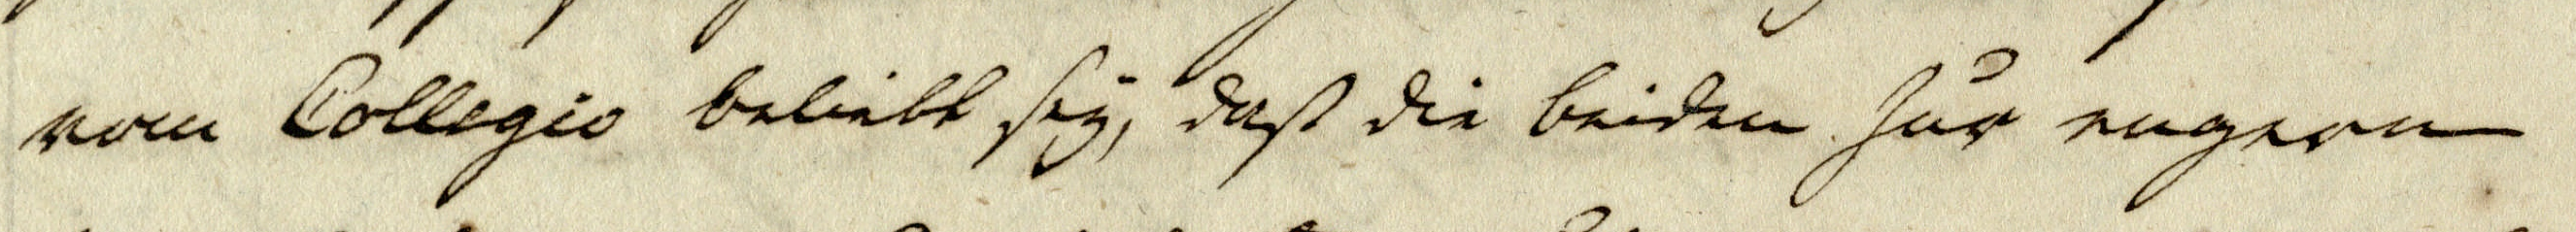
vom Collegio beliebt seÿ, daß die beiden zur engern
